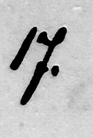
1.
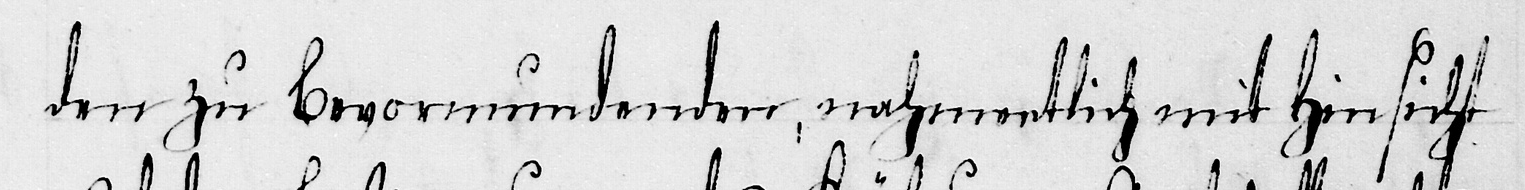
den zu Bevormundenden, nahmentlich mit Hinsicht
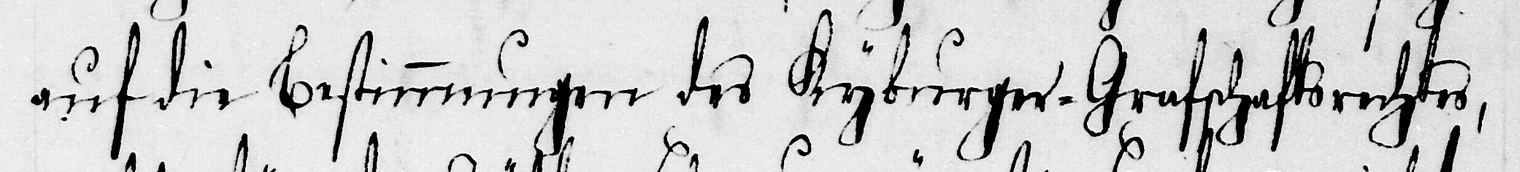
auf die Bestimmungen des Kyburger-Grafschaftsrechtes,
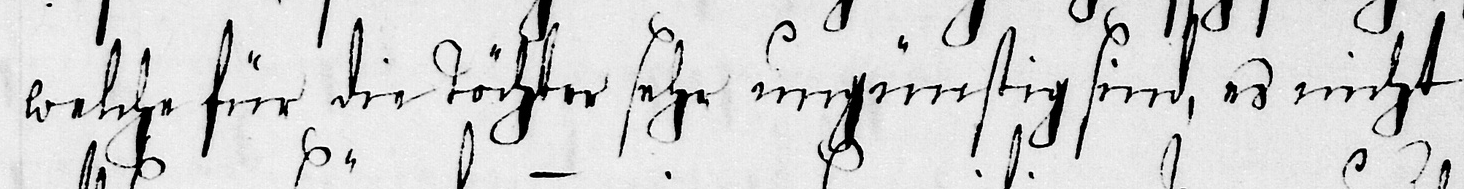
welche für die Töchter sehr ungünstig sind, es nicht
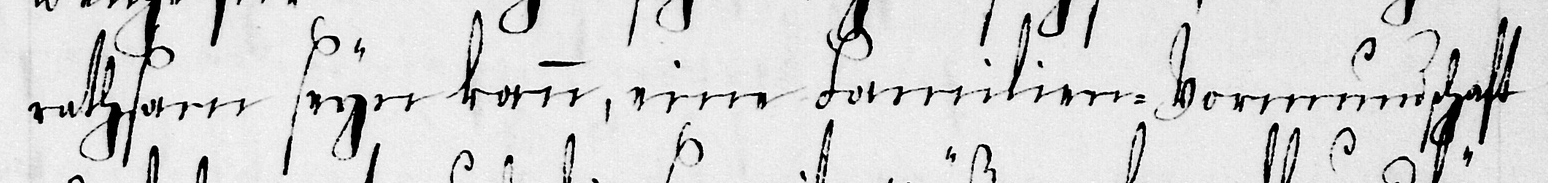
rathsam sein kann, eine Familien-Vormundschaft
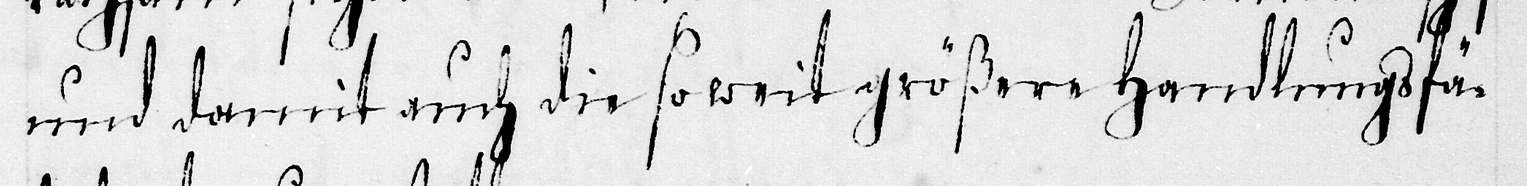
und damit auch die soweit größere Handlungsfä¬
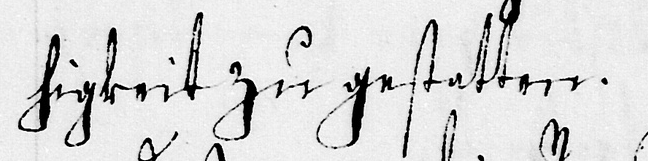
higkeit zu gestatten.
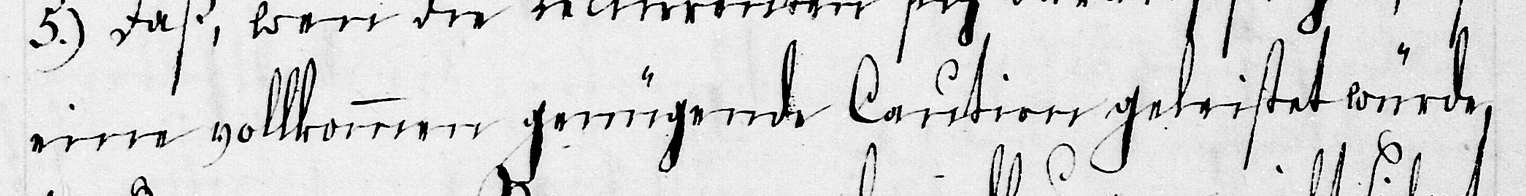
eine vollkommen genügende Caution geleistet würde,
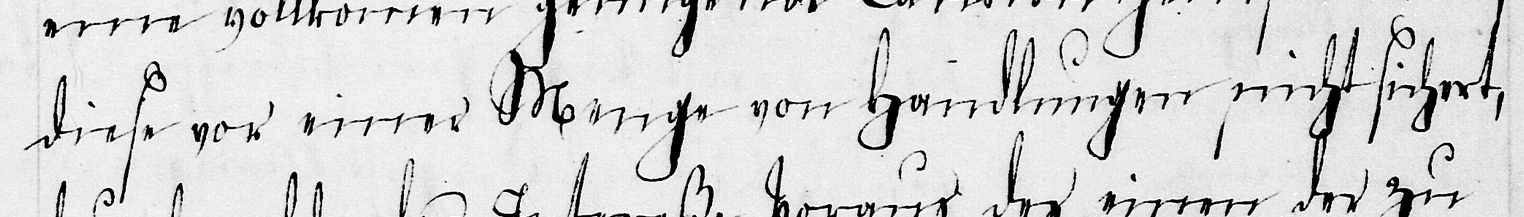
diese vor einer Menge von Handlungen nicht sichert,
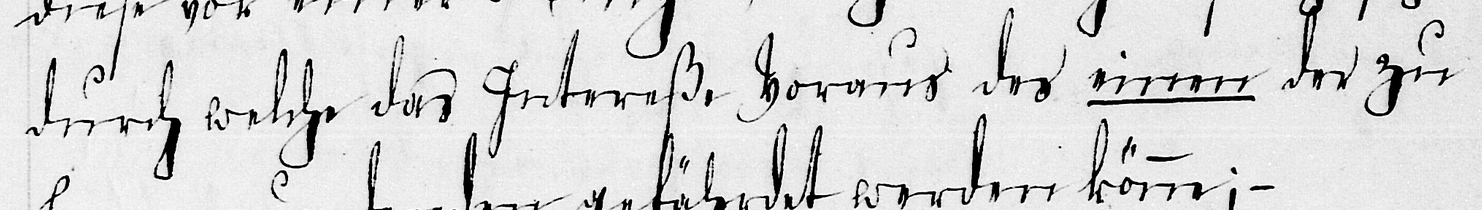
durch welche das Intereße Voraus des einen der zu
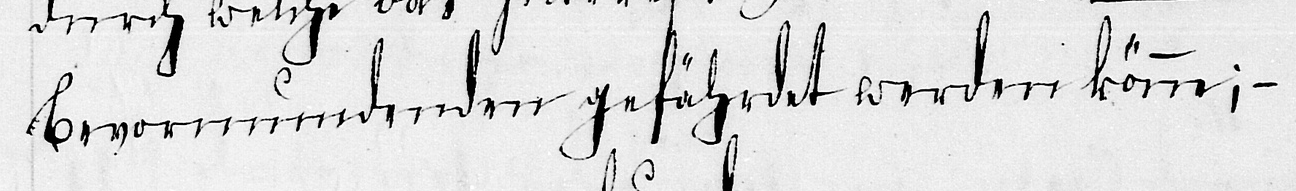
Bevormundenden gefährdet werden könne; –
